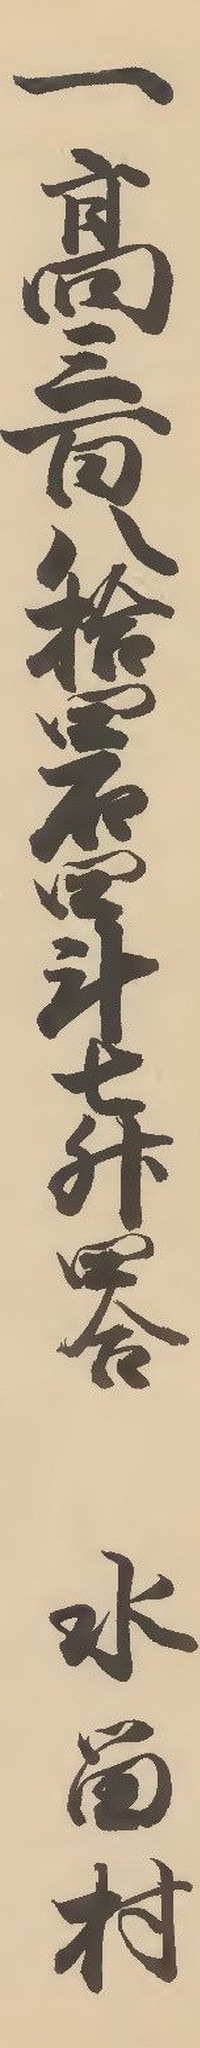一髙三百八拾四石四斗七升四合水留村
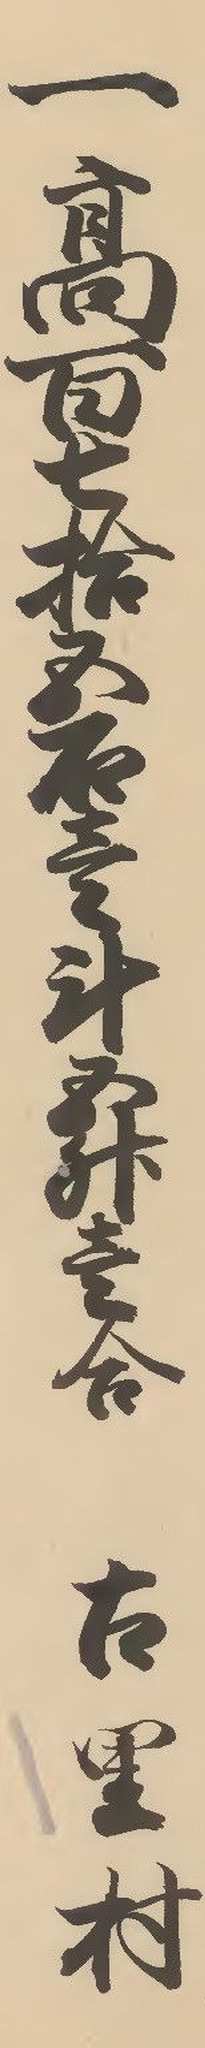一髙百七拾五石壱斗五升壱号古里村
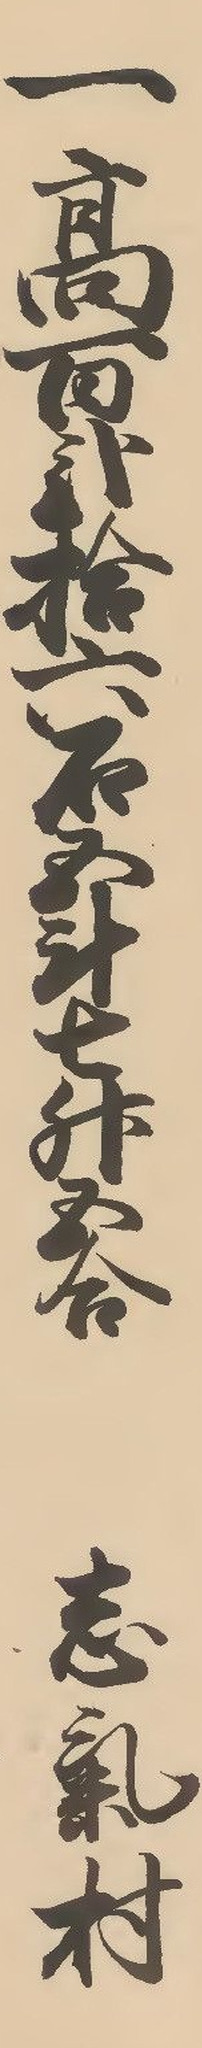一髙百弐拾六石五斗七升五合志気村
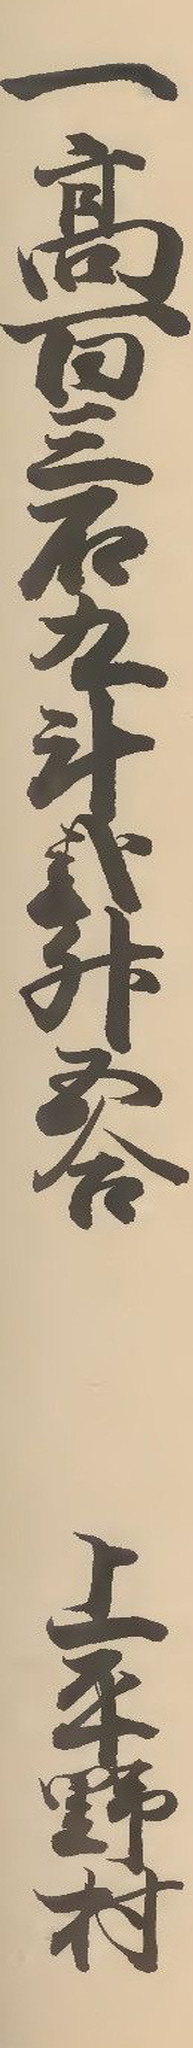一髙百三石九斗弐升五合上平野村
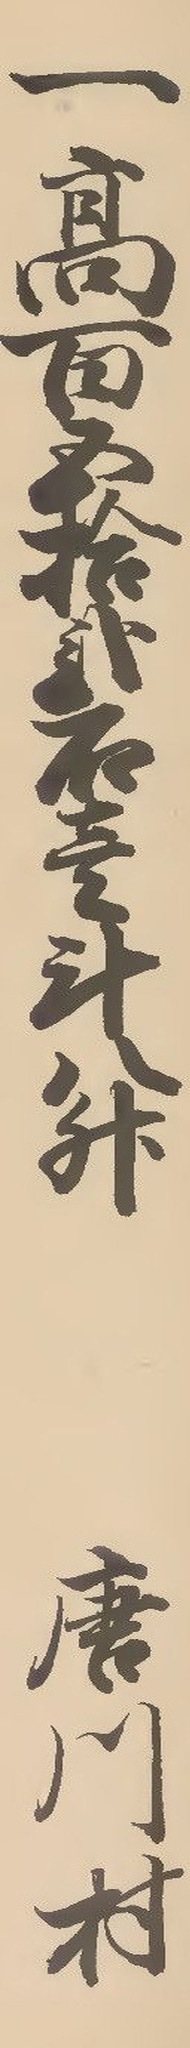一髙百五拾弐石壱斗八升唐川村
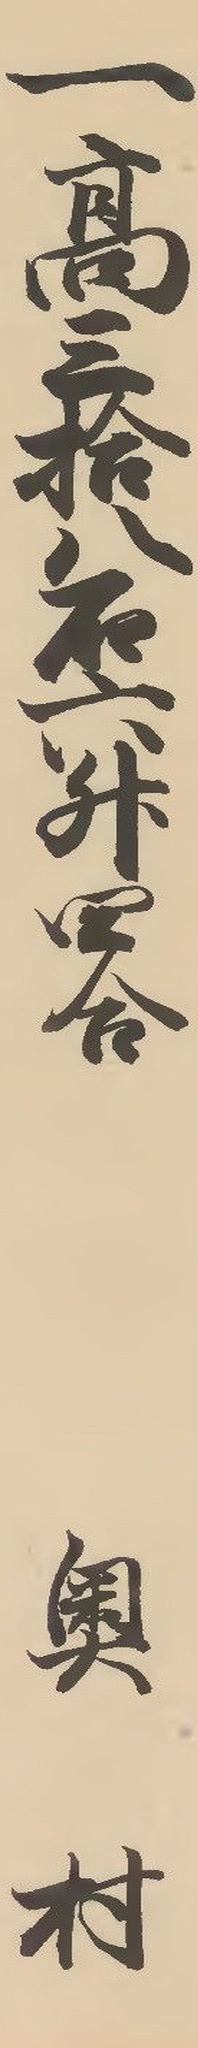一髙三拾八石六升四合奥村
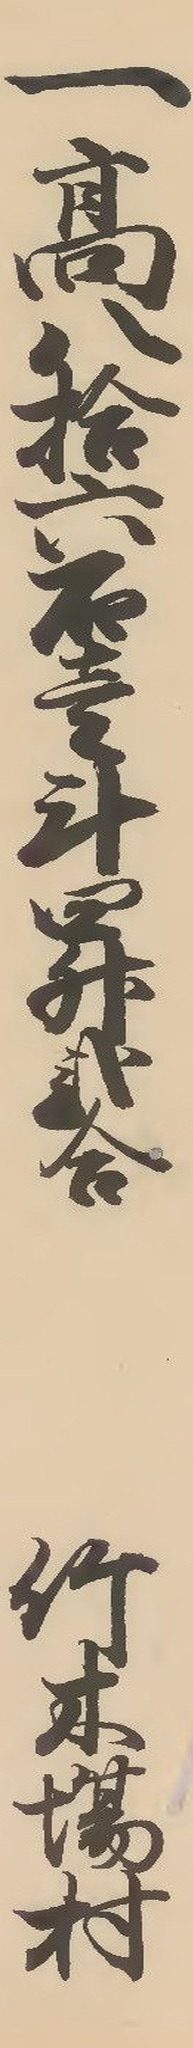一髙八拾六石壱斗四升弐合竹木場村
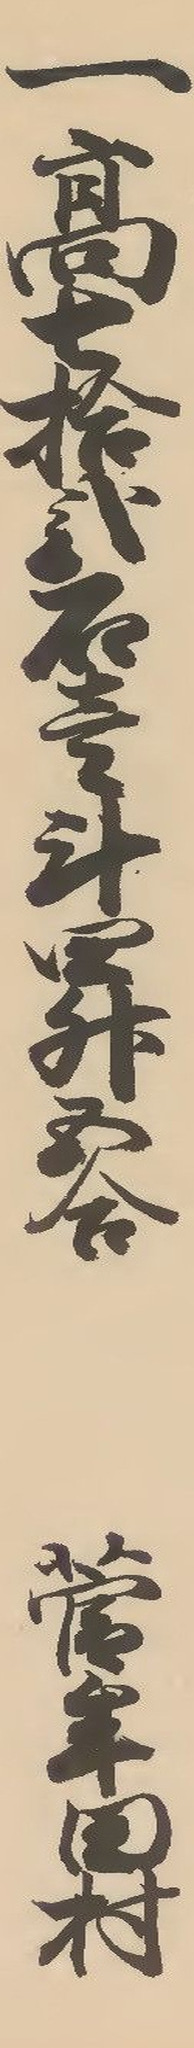一髙七拾弐石壱斗四升五合菅牟田村

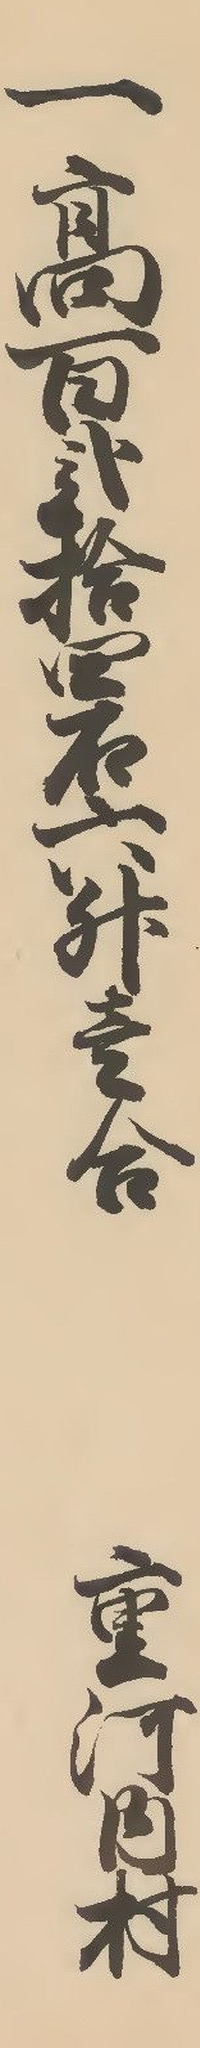一髙百弐拾四石六升壱合重河内村
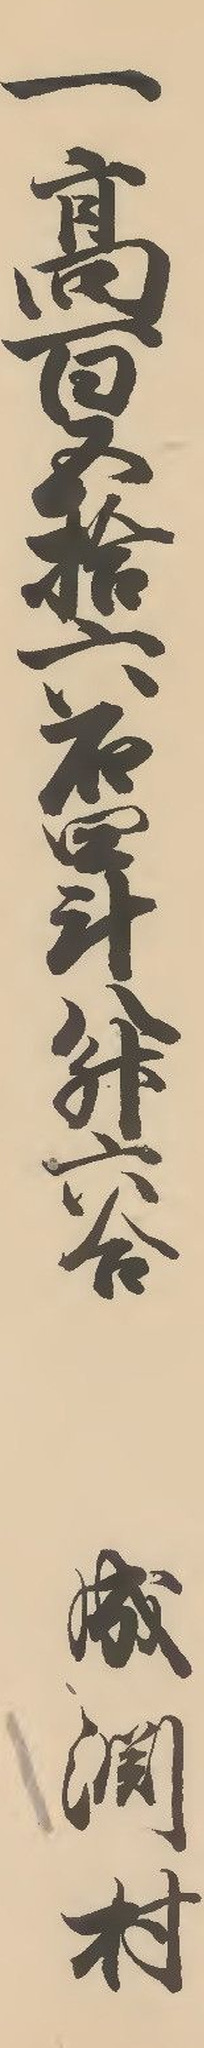一髙百五拾六石四斗八升六合成淵村
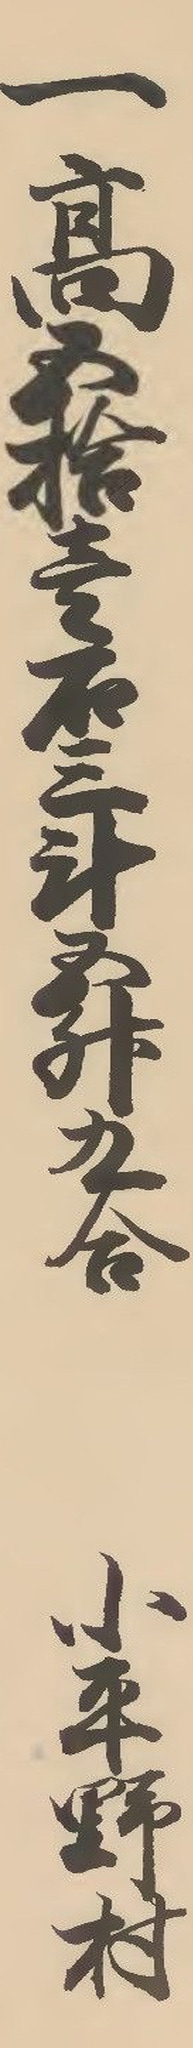一髙五拾壱石三斗五升九合小平野村
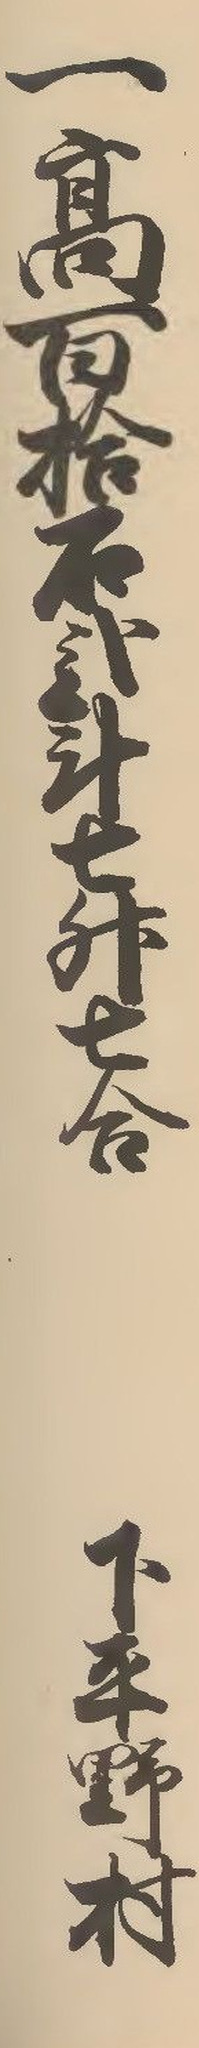一髙百拾石弐斗七升七合下平野村
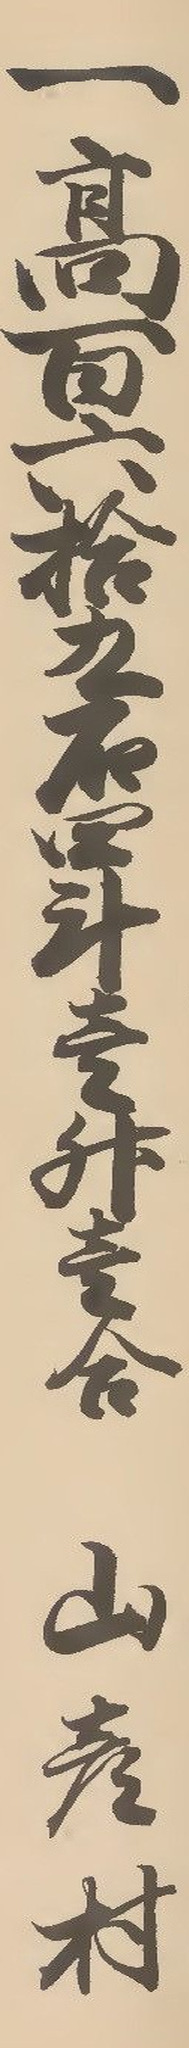一髙百六拾九石四斗壱升壱合山彦村
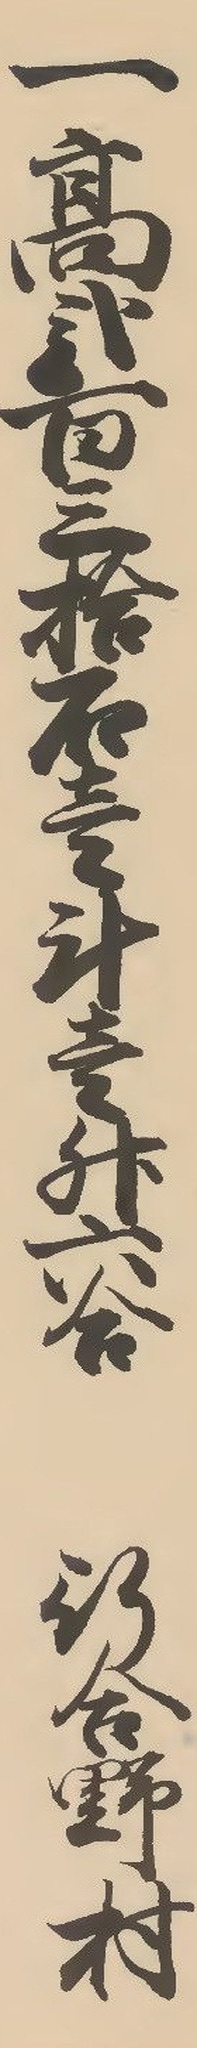一髙弐百三拾石壱斗壱升六合行合野村
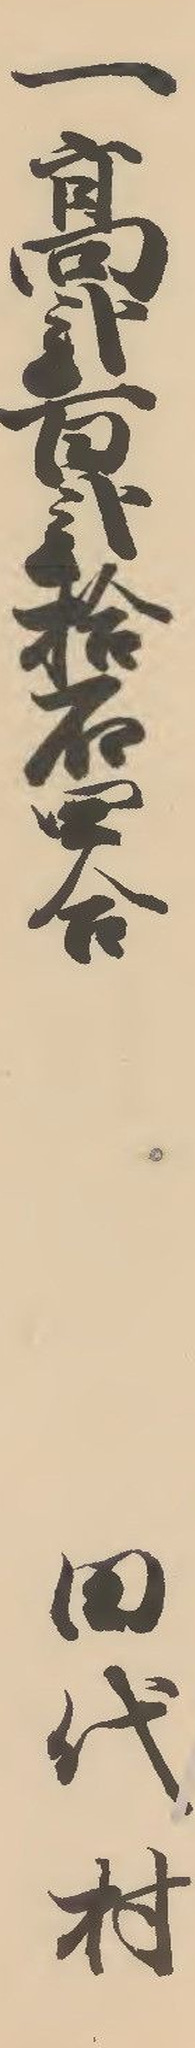一髙弐百弐拾石四合田代村
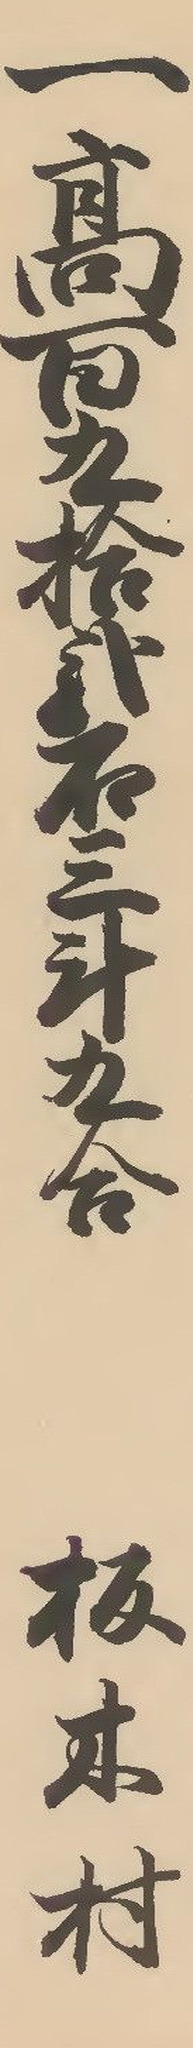一髙百九拾弐石三斗九合板木村
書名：肥前国郷帳
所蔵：国立公文書館 National Archives of Japan
